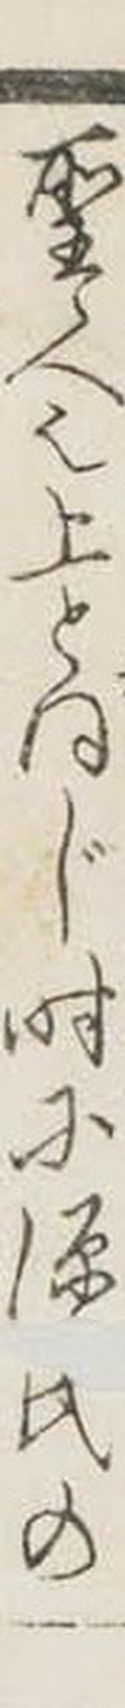聖人也上と同じ時に源氏の
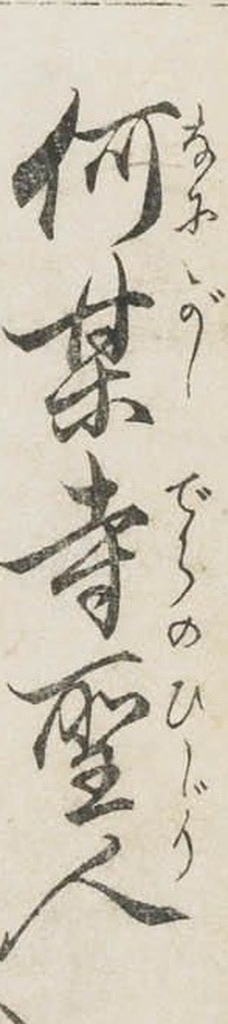何某寺聖人
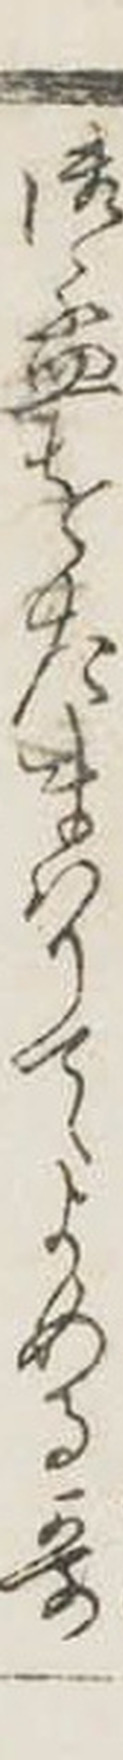御盃をたまはりてよめる哥
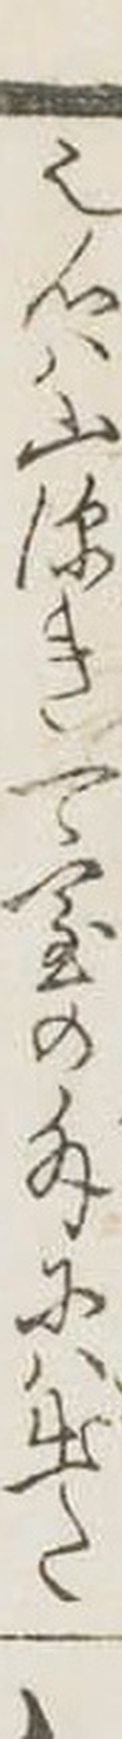也心は山深き一室の外には出た
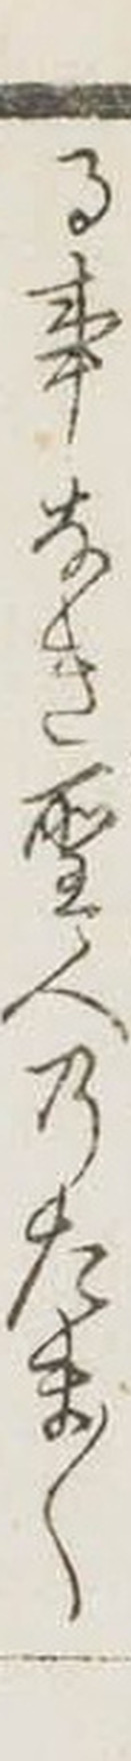る事なき聖人のたま〳〵
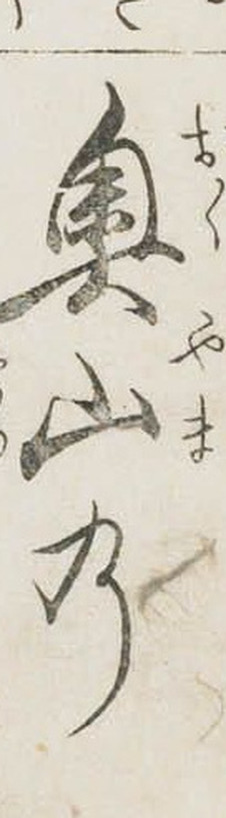奥山の
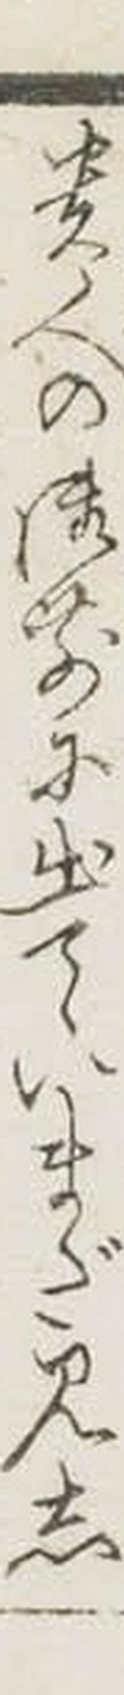貴人の御前に出ていまだ見し
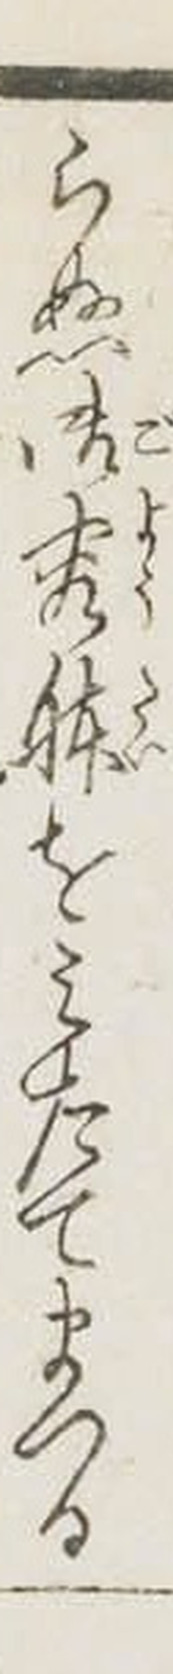らぬ御容体をみたてまつる
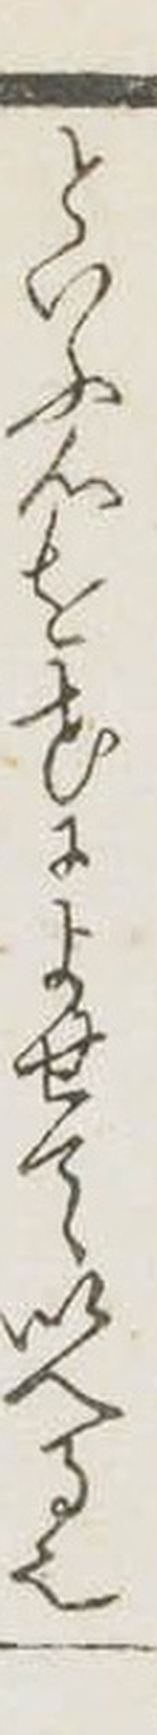といふ心を花によせていへる也
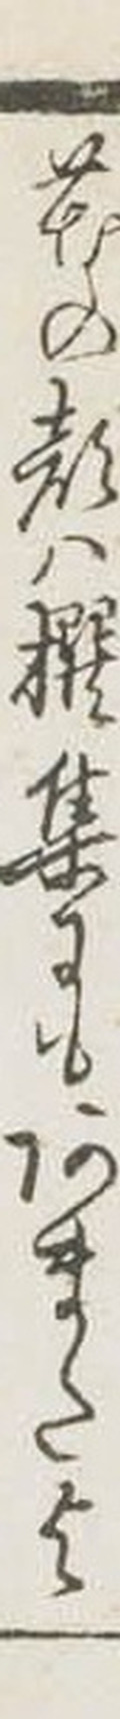花の顔は撰集にもあまたよ
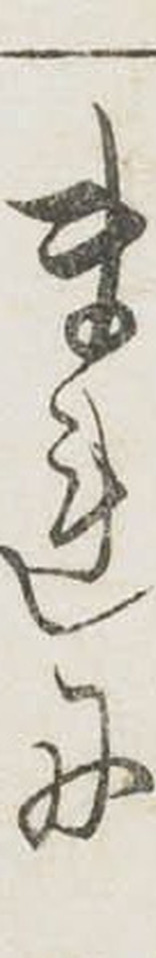まれに
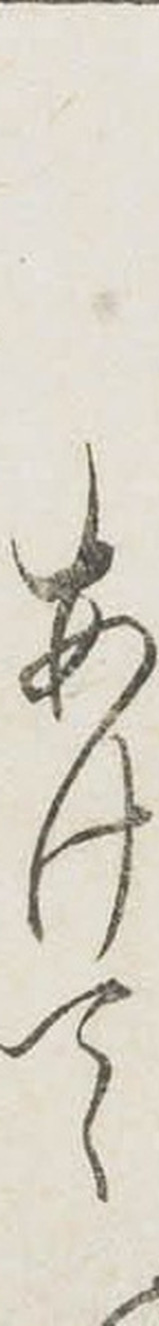あけて
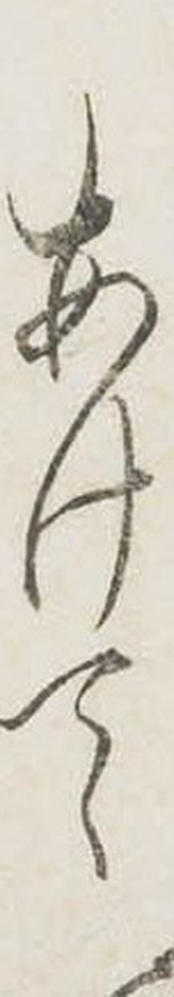あけて
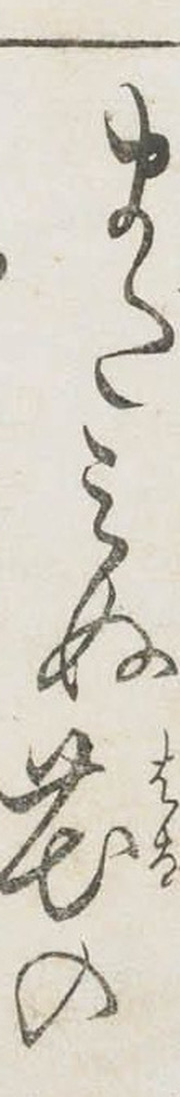まだみぬ花の
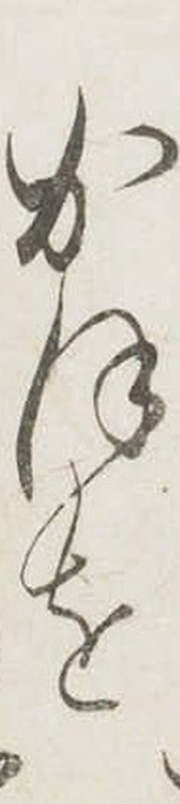かほを
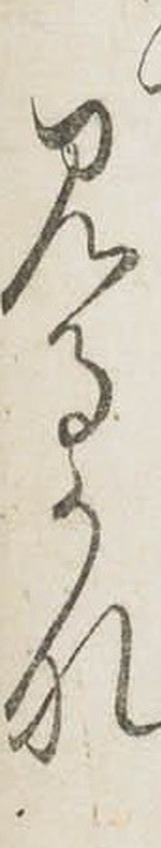見るかな
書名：源氏百人一首
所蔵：東京学芸大学教育コンテンツアーカイブ
